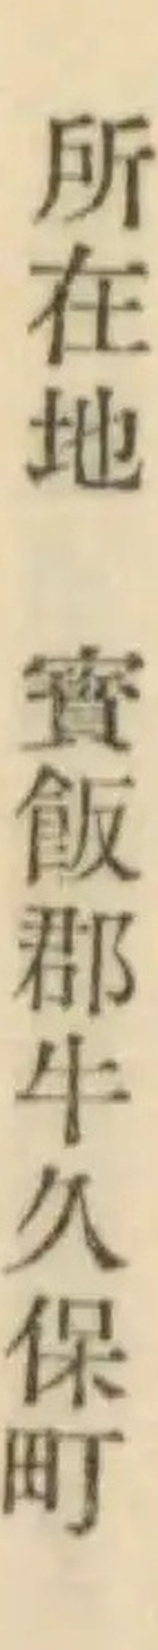所在地宝飯郡牛久保町
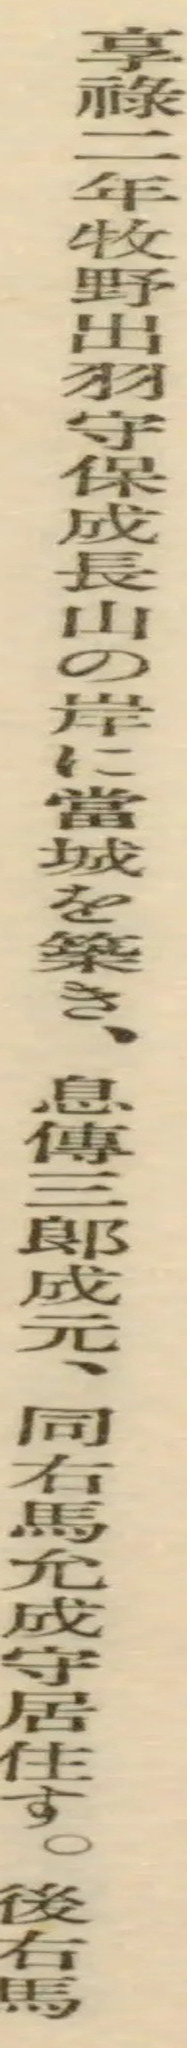享禄二年牧野出羽守保成長山の岸に当城を築き、息伝三郎成元、同右馬允成守居住す。後右馬
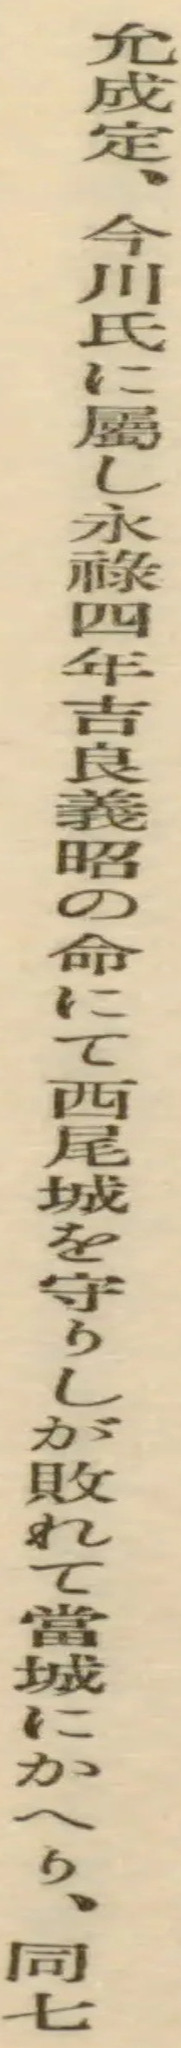允成定、今川氏に属し永禄四年吉良義昭の命にて西尾城を守りしが敗れて当城にかへり、同七
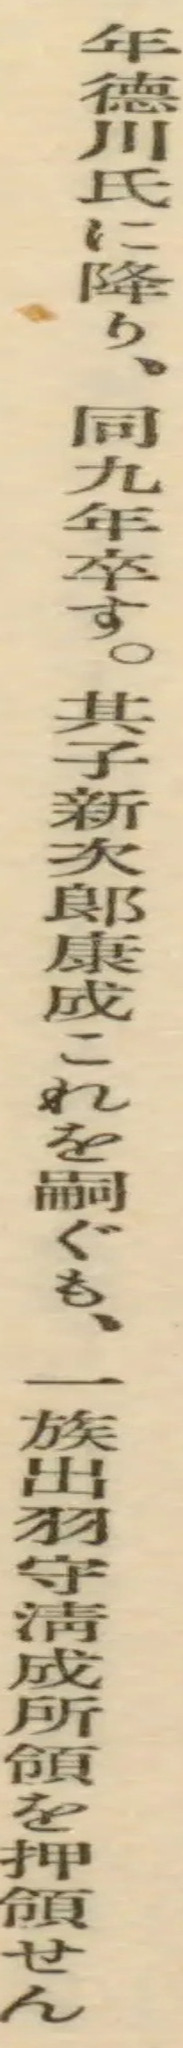年徳川氏に降り、同九年卒す。其子新次郎康成これを嗣ぐも、一族出羽守清成所領を押領せん
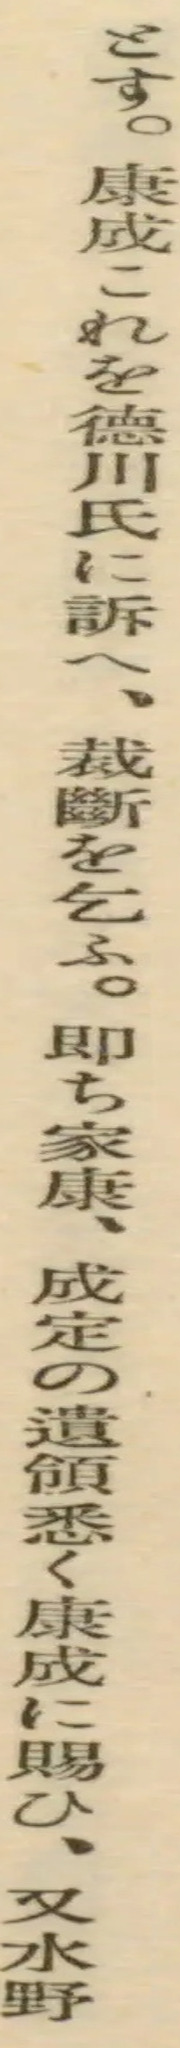とす。康成これを徳川氏に訴へ、裁断を乞ふ。即ち家康、成定の遺領悉く康成に賜ひ、又水野
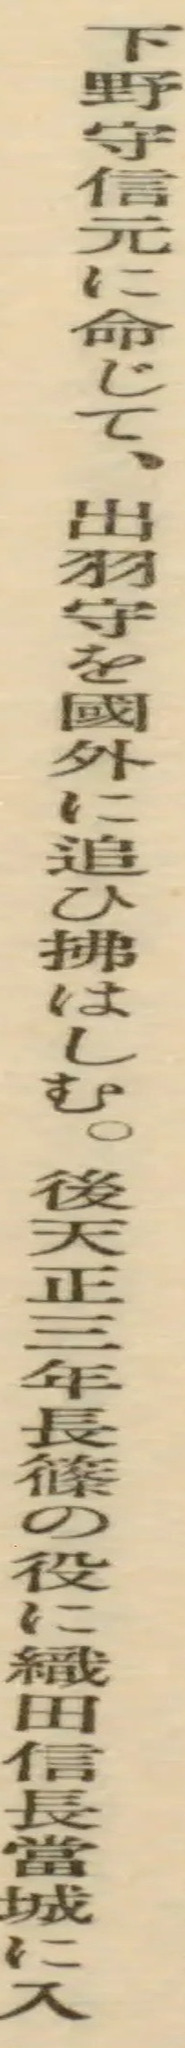下野守信元に命じて、出羽守を国外に追ひ払はしむ。後天正三年長篠の役に織田信長当城に入
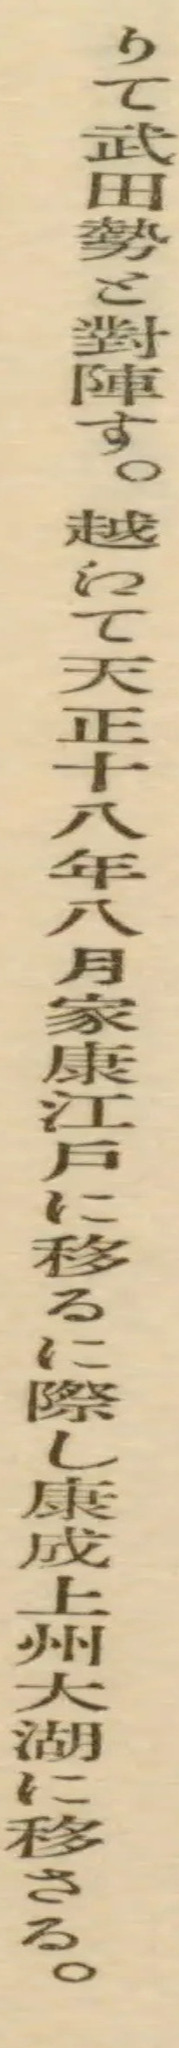りて武田勢と対陣す。越えて天正十八年八月家康江戸に移るに際し康成上州大湖に移さる。
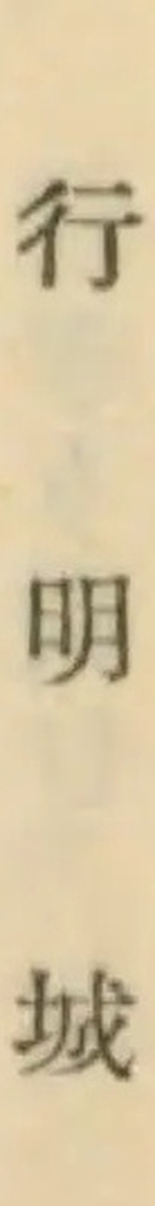行明城
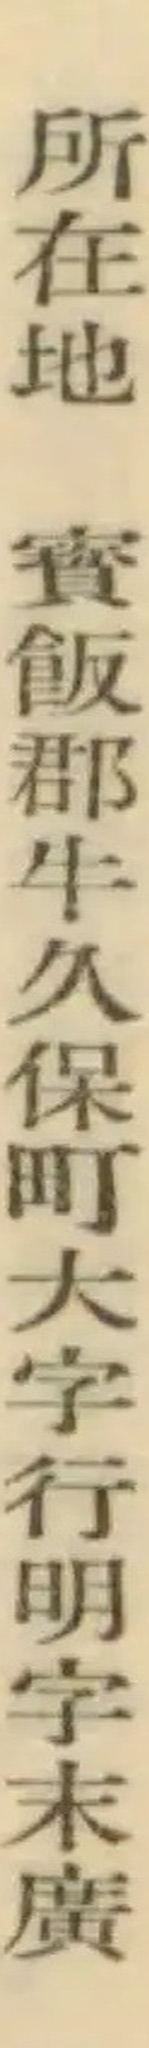所在地宝飯郡牛久保町大字行明字末広
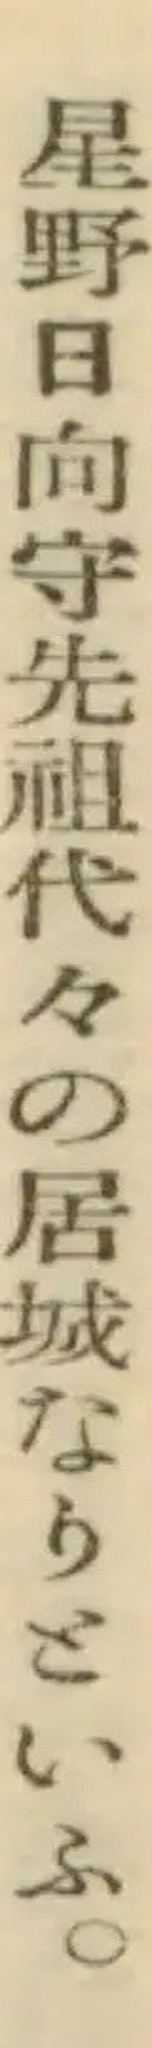星野日向守先祖代々の居城なりといふ。
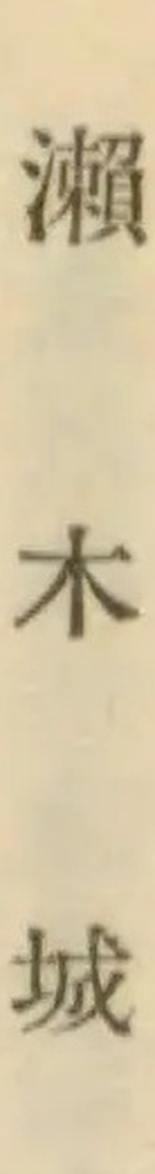瀬木城
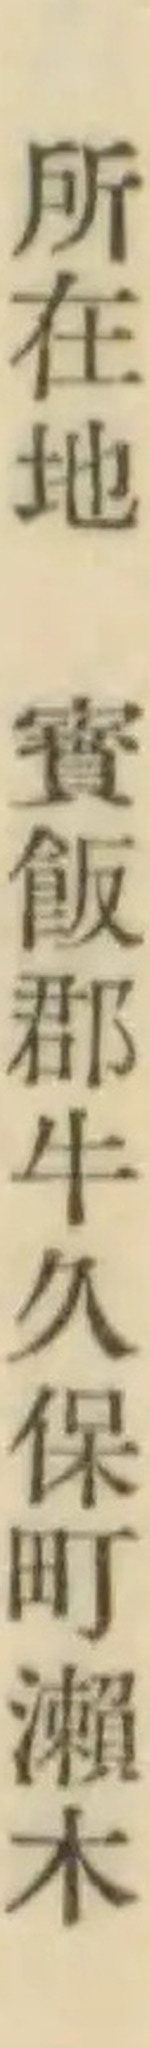所在地宝飯郡牛久保町瀬木
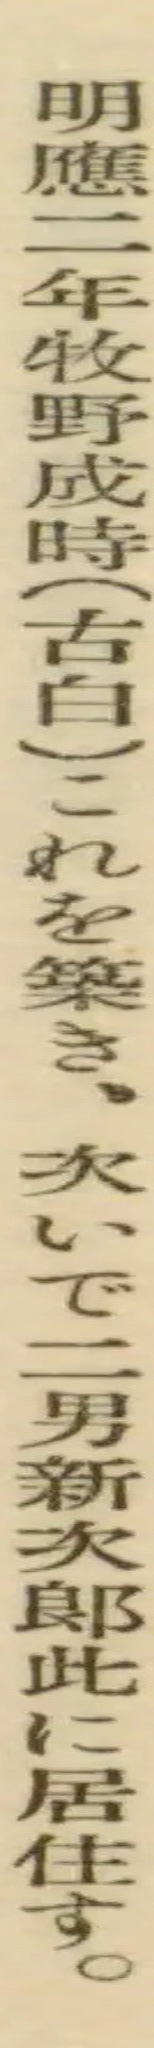明応二年牧野成時(古白)これを築き、次いで二男新次郎此に居住す。
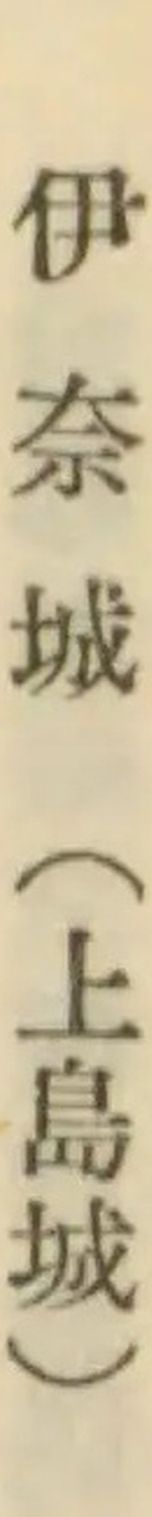伊奈城(上島城)
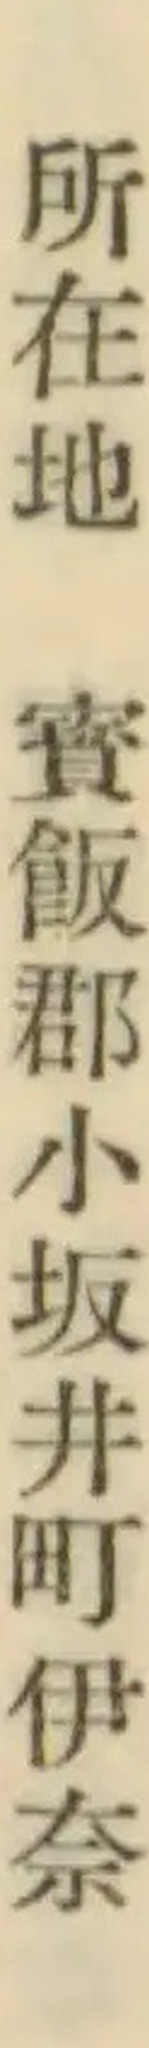所在地宝飯郡小坂井町伊奈
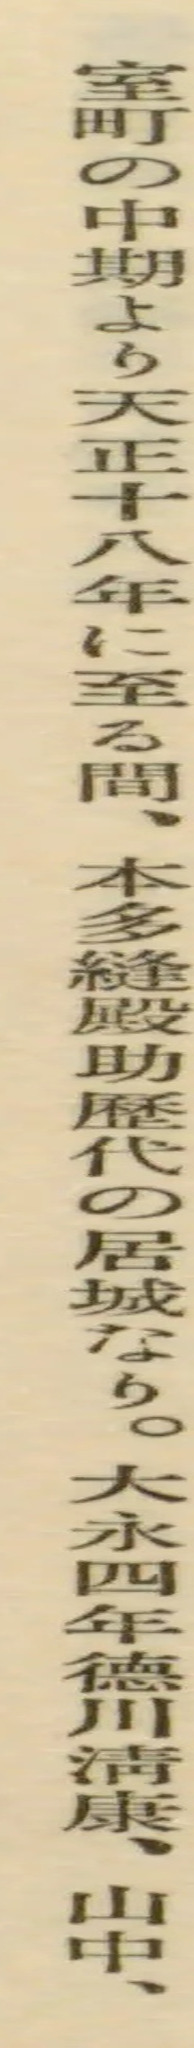室町の中期より天正十八年に至る間、本多縫殿助歴代の居城なり。大永四年徳川清康、山中、
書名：東三河之古城
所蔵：国立国会図書館 National Diet Library, JAPAN
